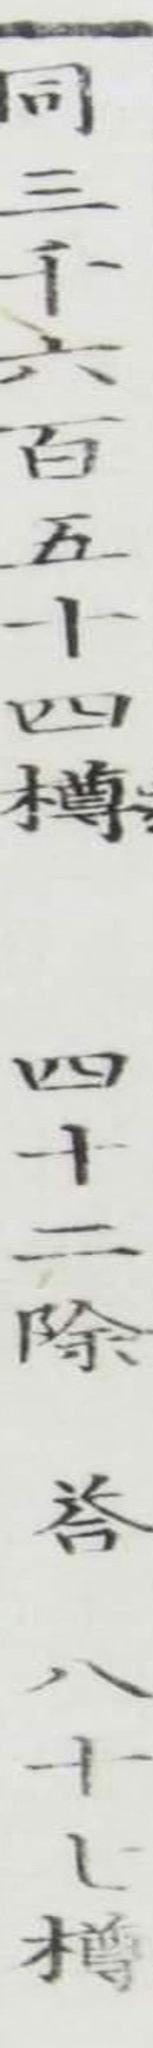同三千六百五十四樽四十二除答八十七樽
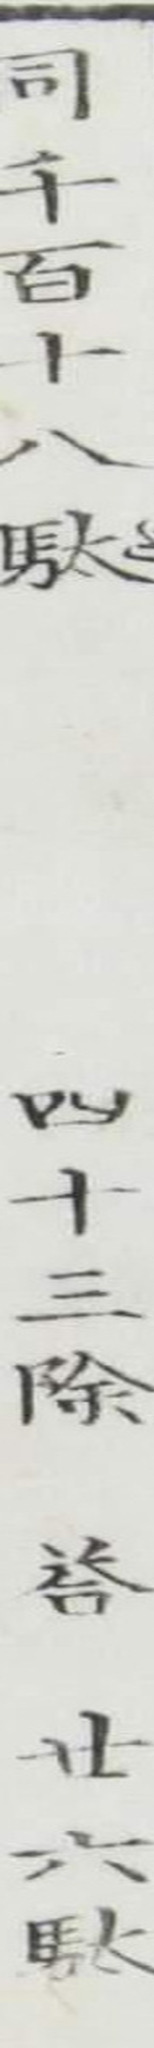同千百十八駄四十三除答廿六駄
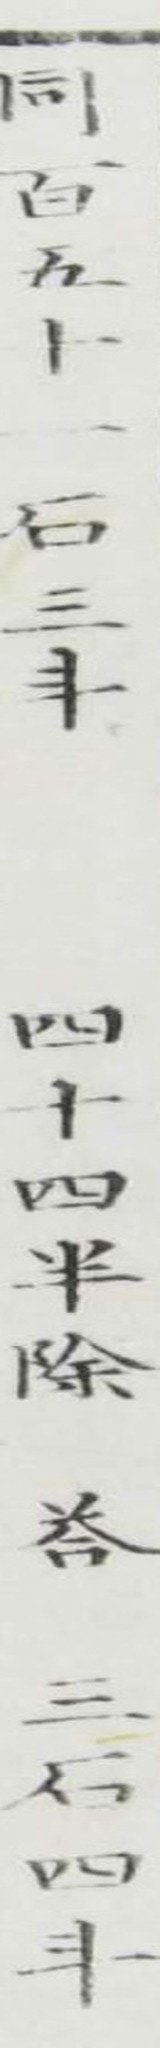同百五十一石三斗四十四半除答三石四斗
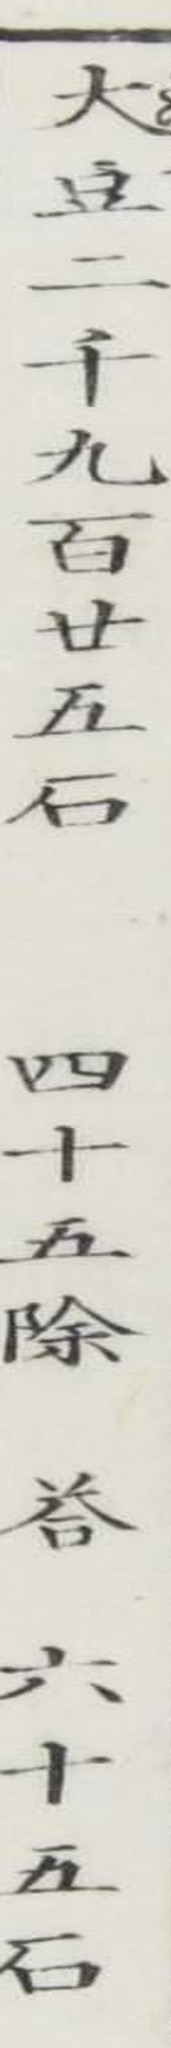大豆二千九百廿五石四十五除答六十五石
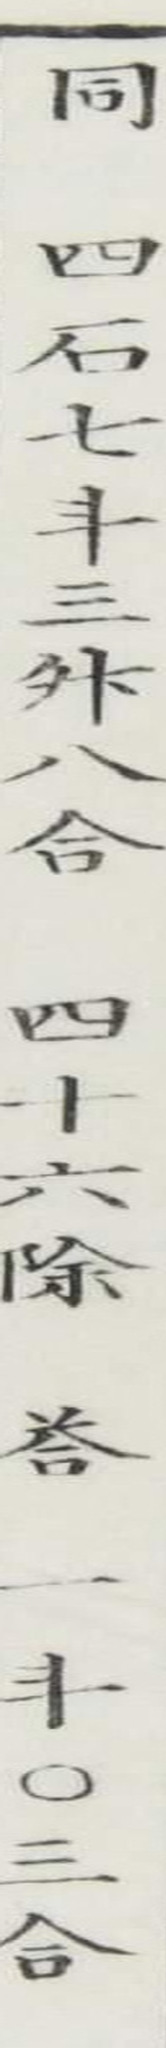同四石七斗三升八合四十六除答一斗〇三合
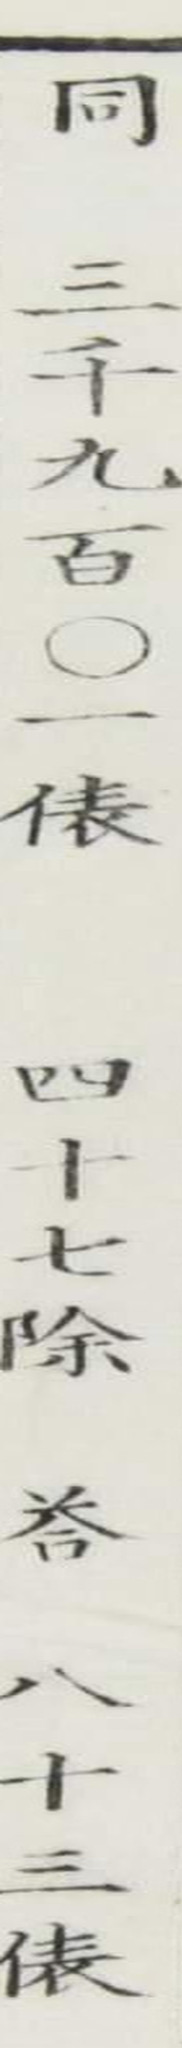同三千九百〇一俵四十七除答八十三俵
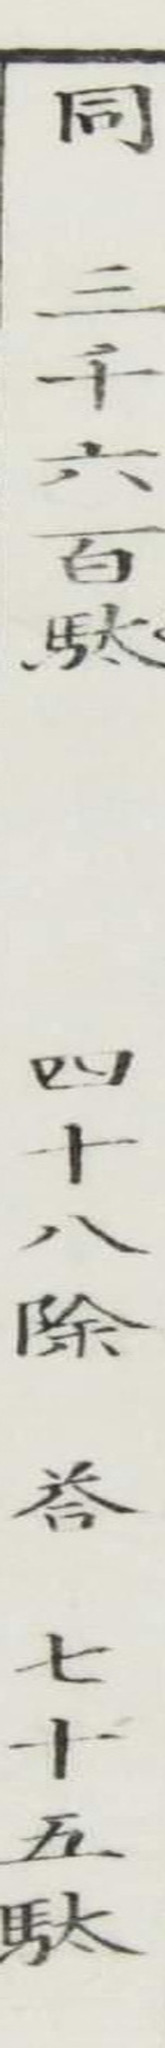同三千六百駄四十八除答七十五駄
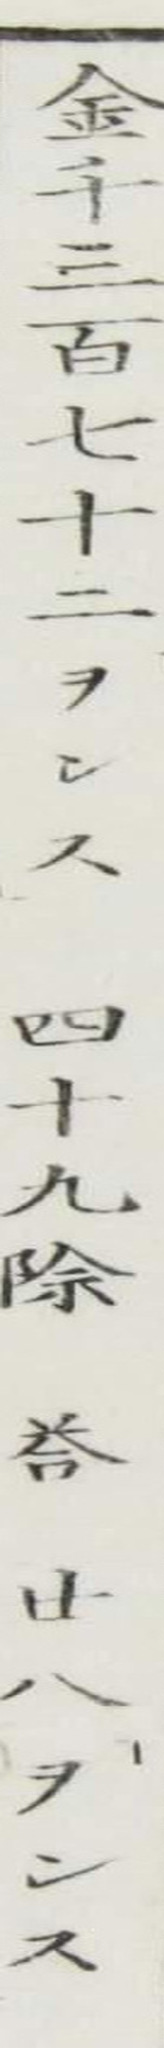金千三百七十二「ヲンス」四十九除答廿八「ヲンス」
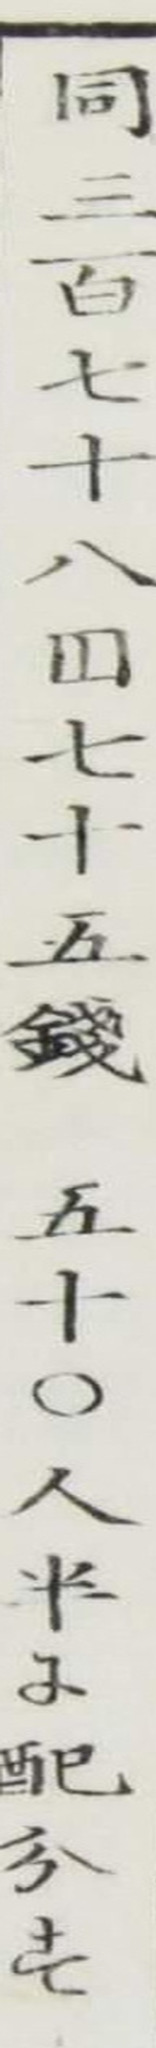同三百七十八円七十五銭五十〇人半に配分す
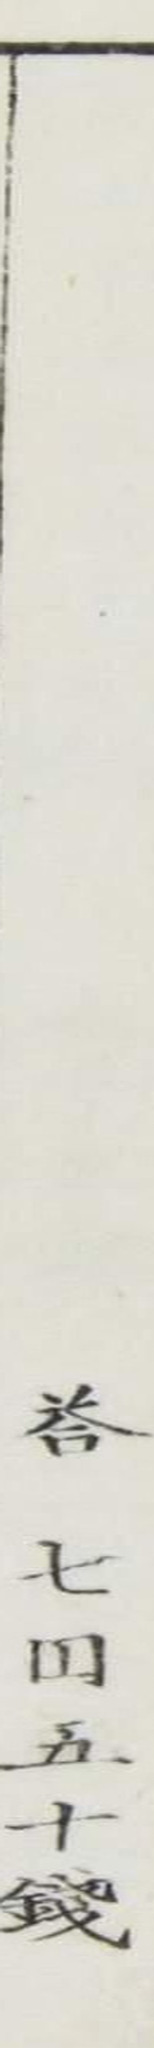答七円五十銭
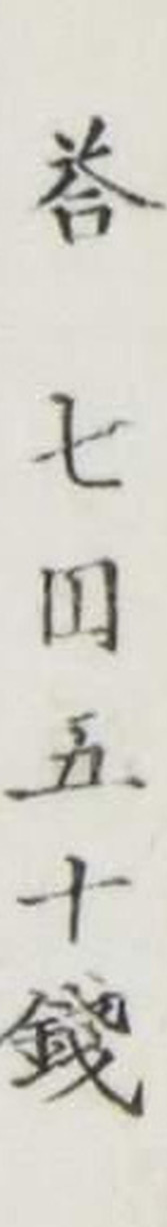答七円五十銭
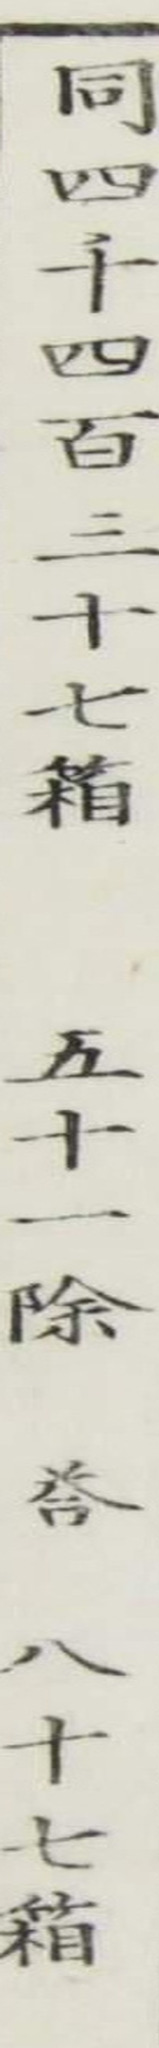同四千四百三十七箱五十一除答八十七箱
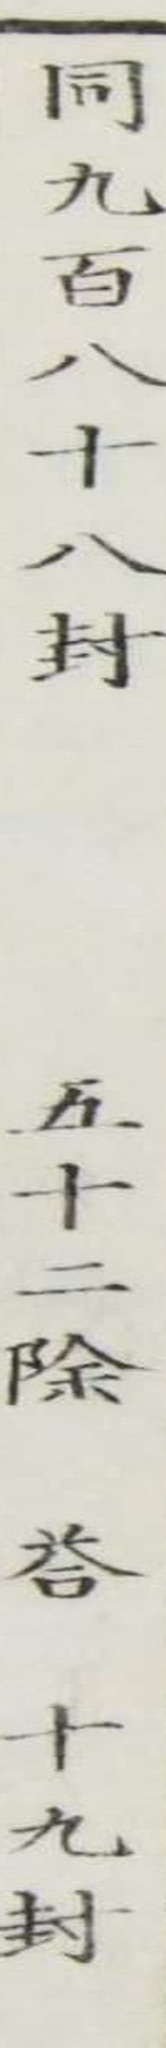同九百八十八封五十二除答十九封
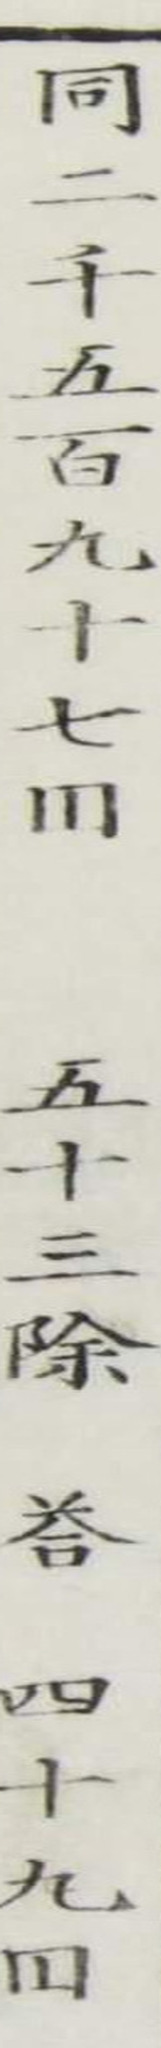同二千五百九十七円五十三除答四十九円
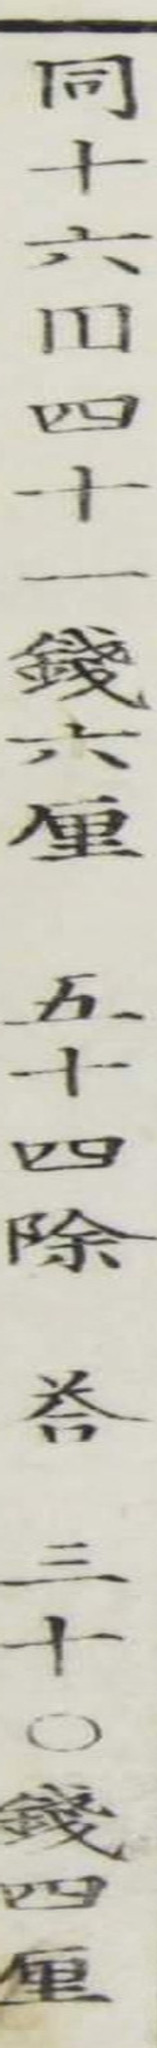同十六円四十一銭六厘五十四除答三十〇銭四厘

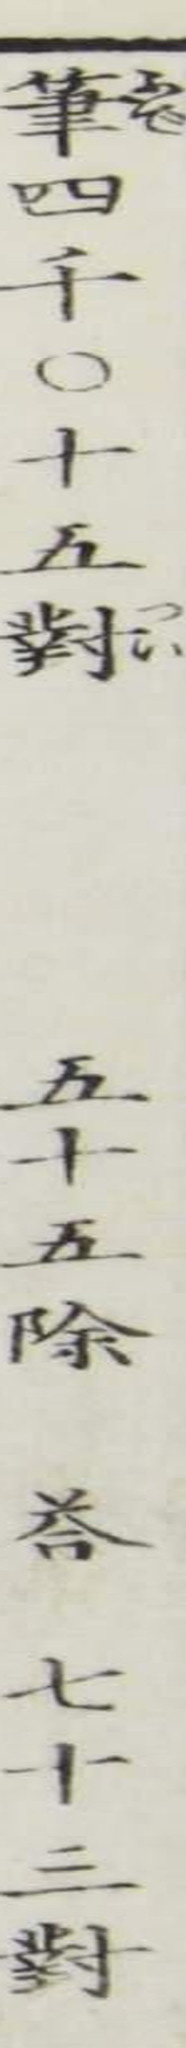筆四千〇十五対五十五除答七十三対
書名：明治小學塵劫記 卷1
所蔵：東京学芸大学教育コンテンツアーカイブ
